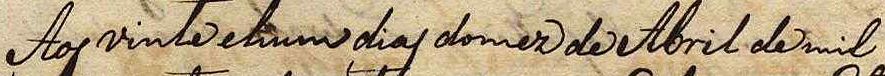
Aos vinte e hum dias do mez de Abril de mil
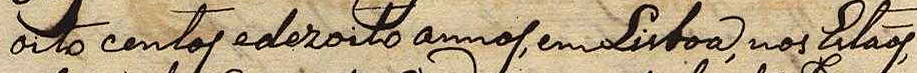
oitocentos e dezoito annos, em Lisboa, nos Estáos,
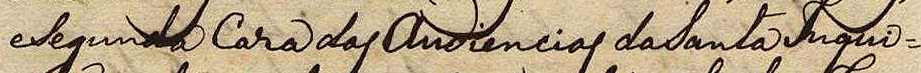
e segunda Caza das audiencias da Santa Inqui
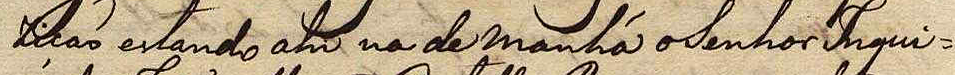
ziçaõ estando ahi na de manhã o Senhor Inqui
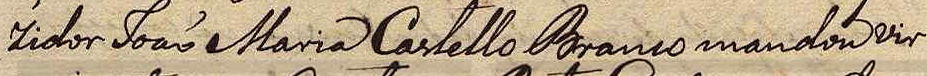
zidor Ioaõ Maria Castello Branco mandou vir
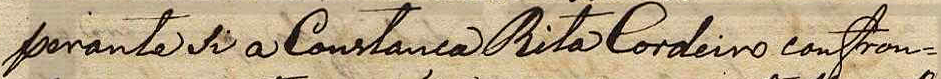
perante si a Constança Rita Cordeiro confron
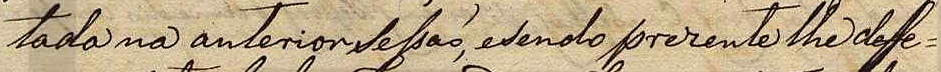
tada na anterior sessaõ, e sendo prezente lhe deffe
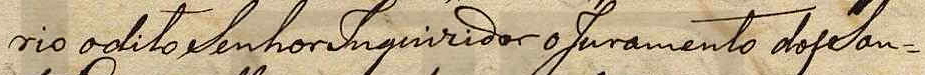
rio o dito Senhor Inquizidor o Juramento dos San
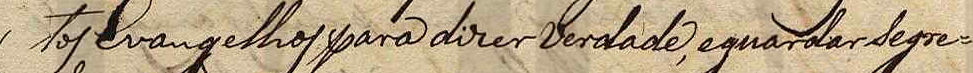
tos Evangelhos para dizer verdade, e guardar segre
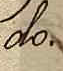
do.
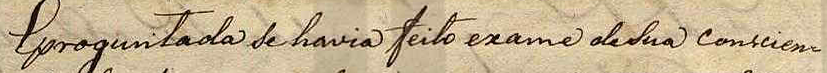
E proguntada se havia feito exame de sua conscien
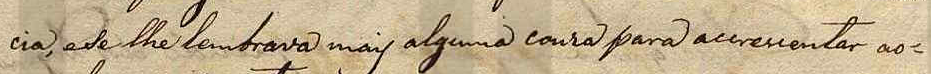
cia, e se lhe lembrava mais alguma couza para accrescentar ao
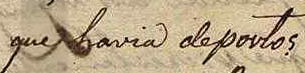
que havia deposto?
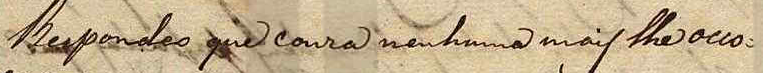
Respondeo que couza nenhuma mais lhe occo
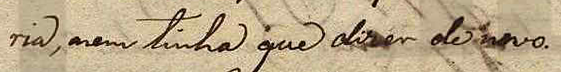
ria, nem tinha que dizer de novo.
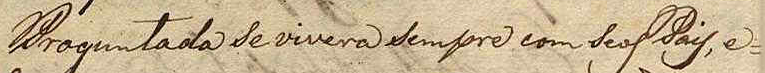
Proguntado se vivera sempre com seos Pais, e
